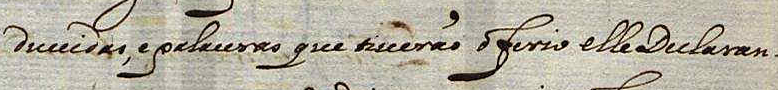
duuidas, e palauras que tiuerão o ferio elle Declaran
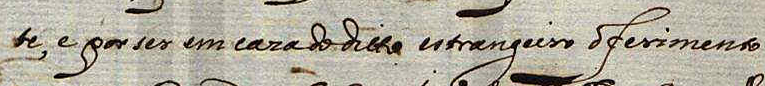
te, e por ser em caza do ditto estrangeiro o ferimento
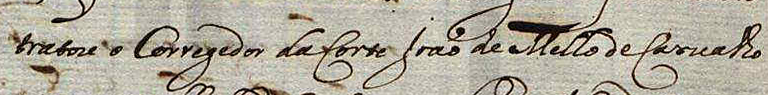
tratou o Corregedor da Corte João de Mello de Carualho
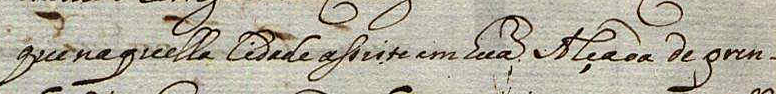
que naquella Cidade assiste em huā Alçada de pren
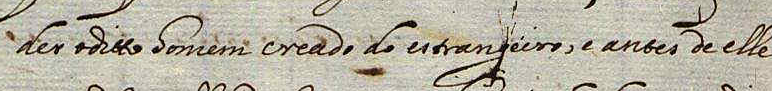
der o ditto homem creado do estrangeiro, e antes de elle
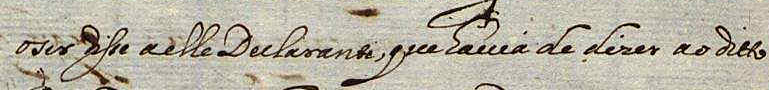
o ser disse a elle Declarante, que hauia de dizer ao ditto
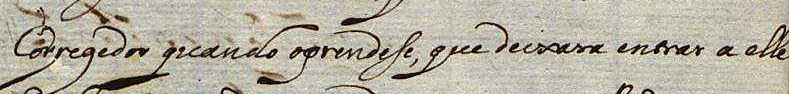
Corregedor quando o prendese, que deixara entrar a elle
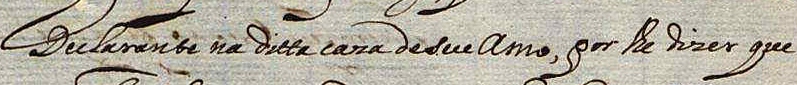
Declarante na ditta caza de seu amo, por lhe dizer que
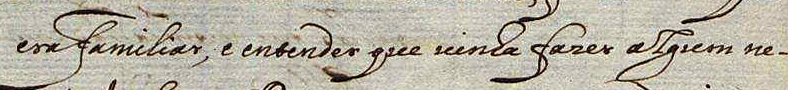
era familiar, e entender que uinha fazer algum ne
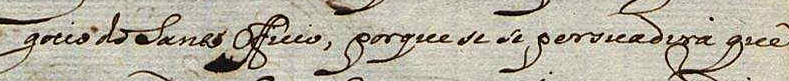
gocio do Santo Officio, porque se se persuadira que
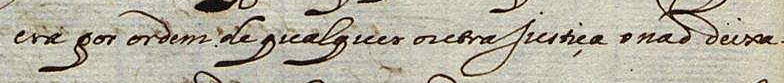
era por ordem de qualquer outra Justiça o naõ deixa
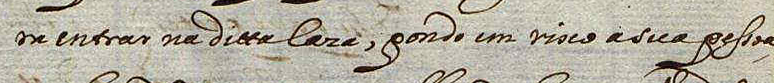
ra entrar na ditta Caza, pondo em risco a sua pessoa
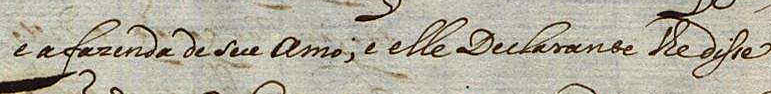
e a fazenda de seu amo, e elle Declarante lhe disse
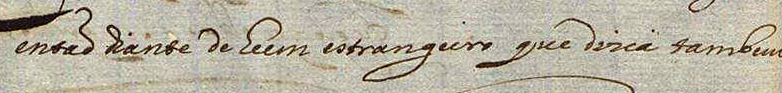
então diante de hum estrangeiro que dizia tambem
